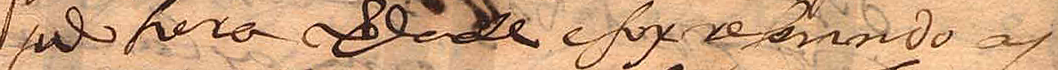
tudo hera ꝟdade e foy referindo as
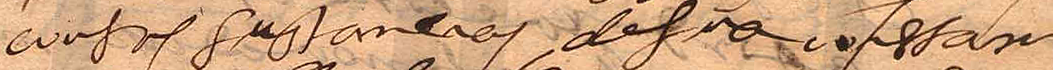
cousas sustancias de sua cōfisam
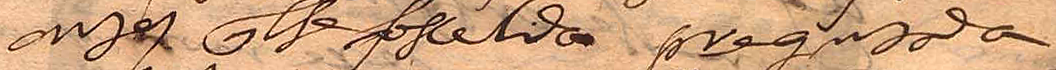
antes q̄ lhe fosse lida pregutada
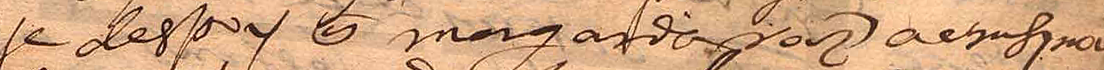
se despois q̄ margarida roiz̄ a emsynou
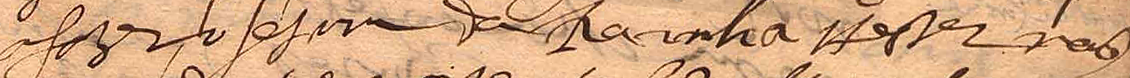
a fazer o Jejum da Rainha Hester naõ
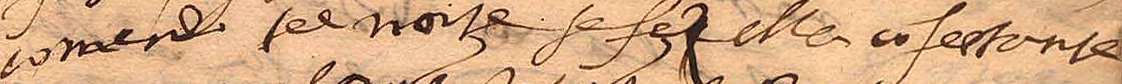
comendo tee noite se fez ella cōfessante
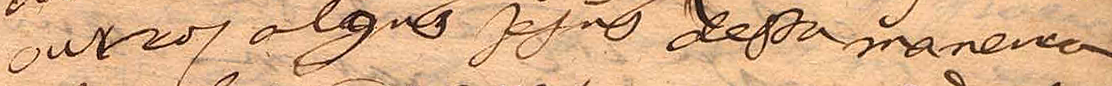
outros algūs Jejus̄ desta maneira
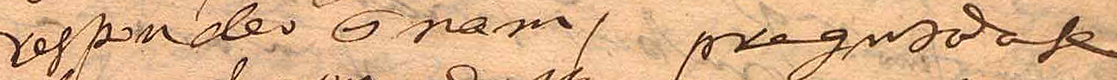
respondeo q̄ nam / pregutada se
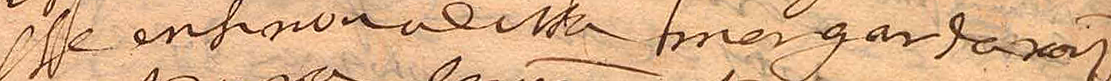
lhe ensinou a ditta margarda roīz
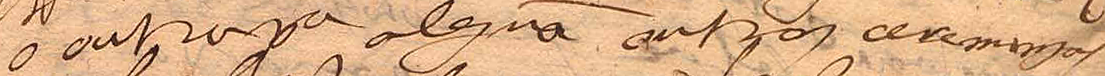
o outra pa algūa outras ceremonjas
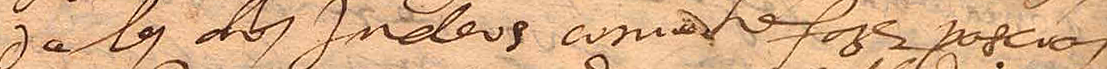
da lej dos Judeos como ho fazer pascoas
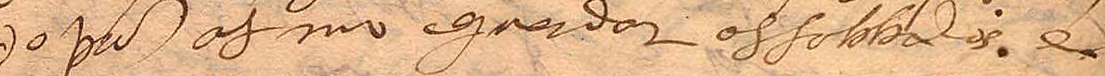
do paõ asmo e guardar os sabbados e
